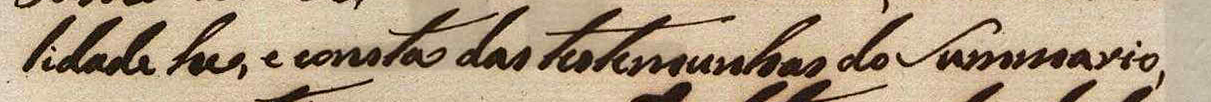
lidade he, e consta das testemunhas do Summario,
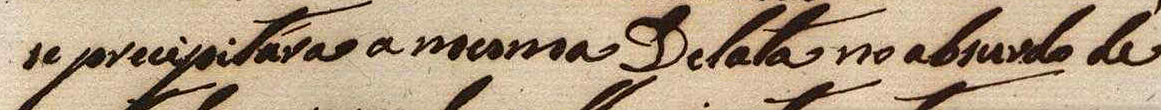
se precipitára a mesma Delata no absurdo de
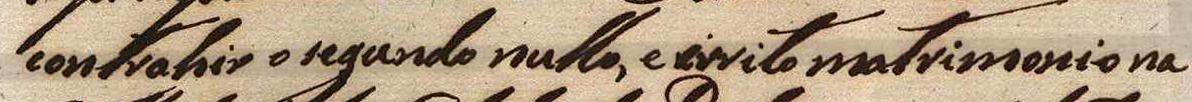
contrahir o segundo nullo, e irrito matrimonio na
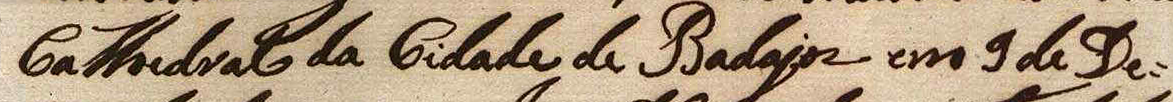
Cathedral da Cidade de Badajoz em 9 de De
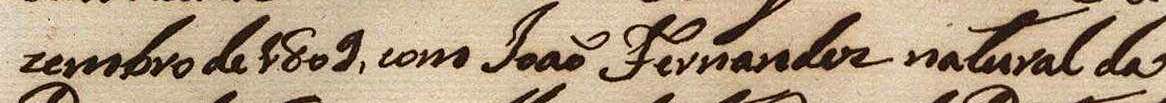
zembro de 1809, com Ioaõ Fernandez natural da
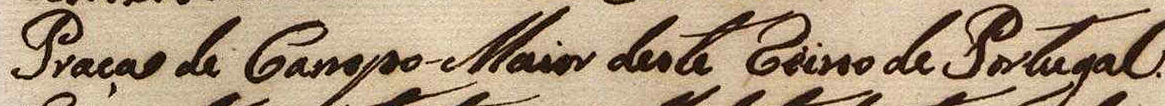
Praça de Campo Maior deste Reino de Portugal.
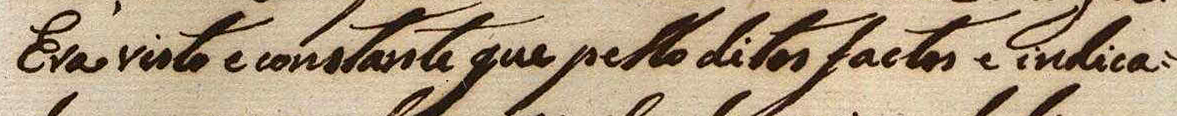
Era visto e constante que pello ditos factos e indica
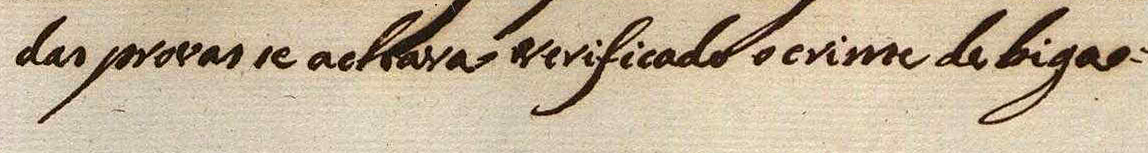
das provas se achava verificado o crime de biga
